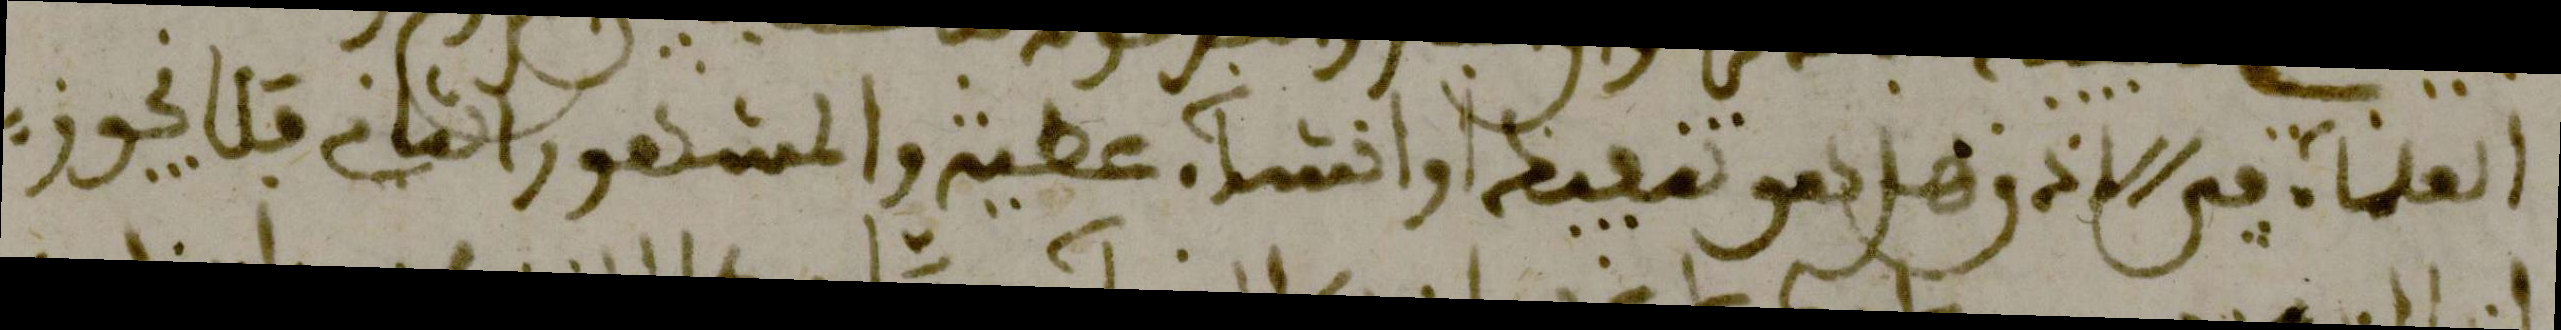العلماء في الاذن هل هو تقييد او انشاء عطية والمشهور الثاني فلا يجوز
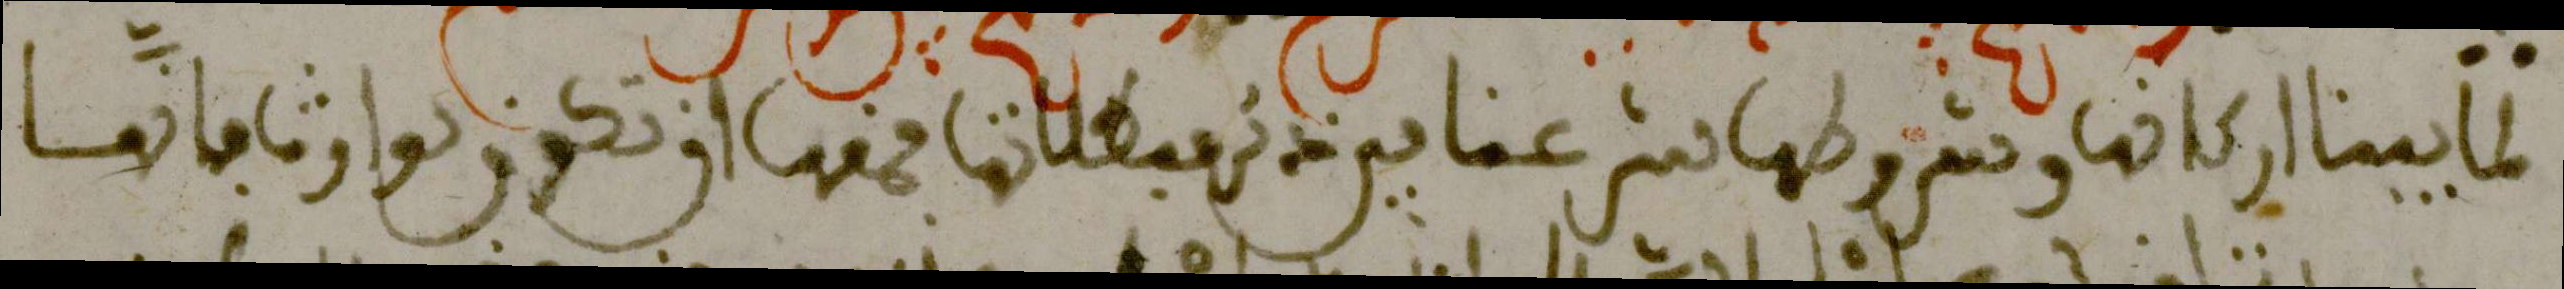لما يبنا ار كانها وشروطها شرعنا في ذكر مبطلاتها فمنها ان تكون لوارث فانّها
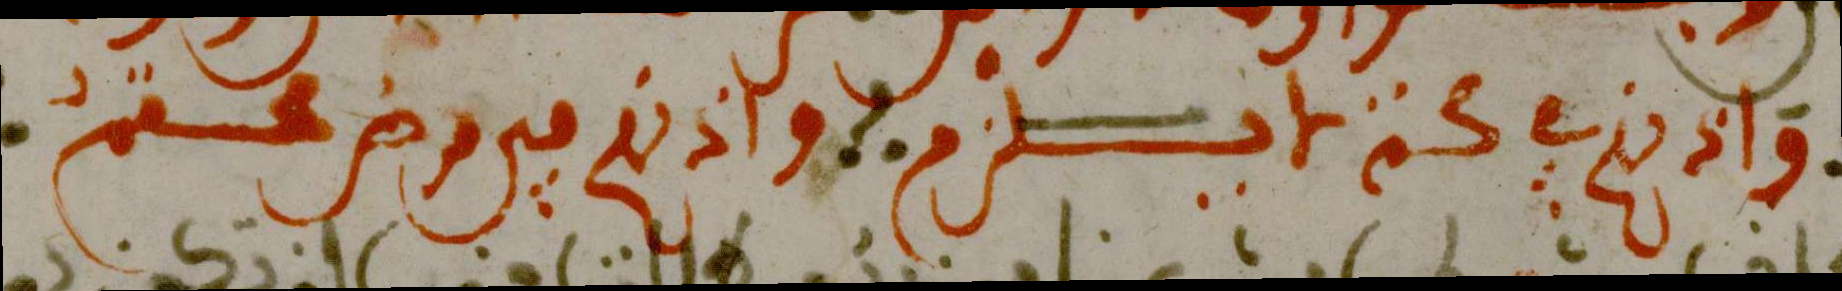واذ نهم في صحة لا يلزم واذ نهم في مرض محتم
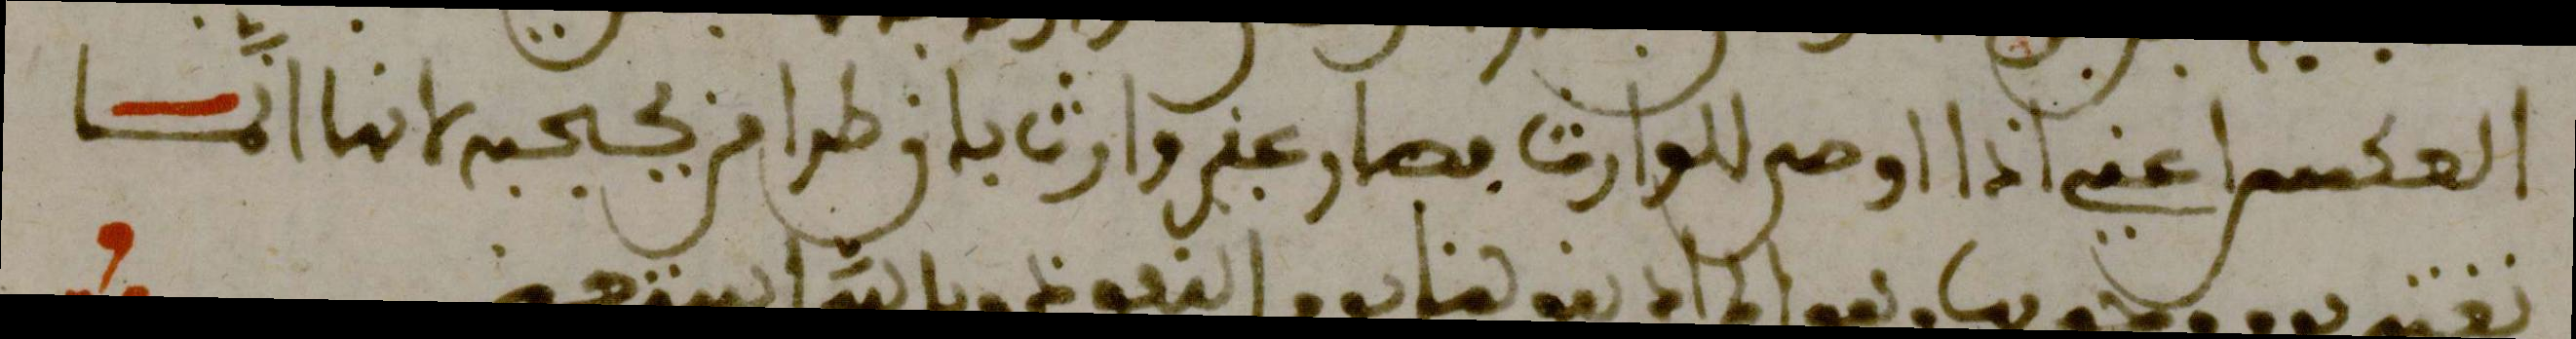العكس اعني اذا اوصى للوارث فصار غير وارث بان طرا من يحجبه لانها انّما
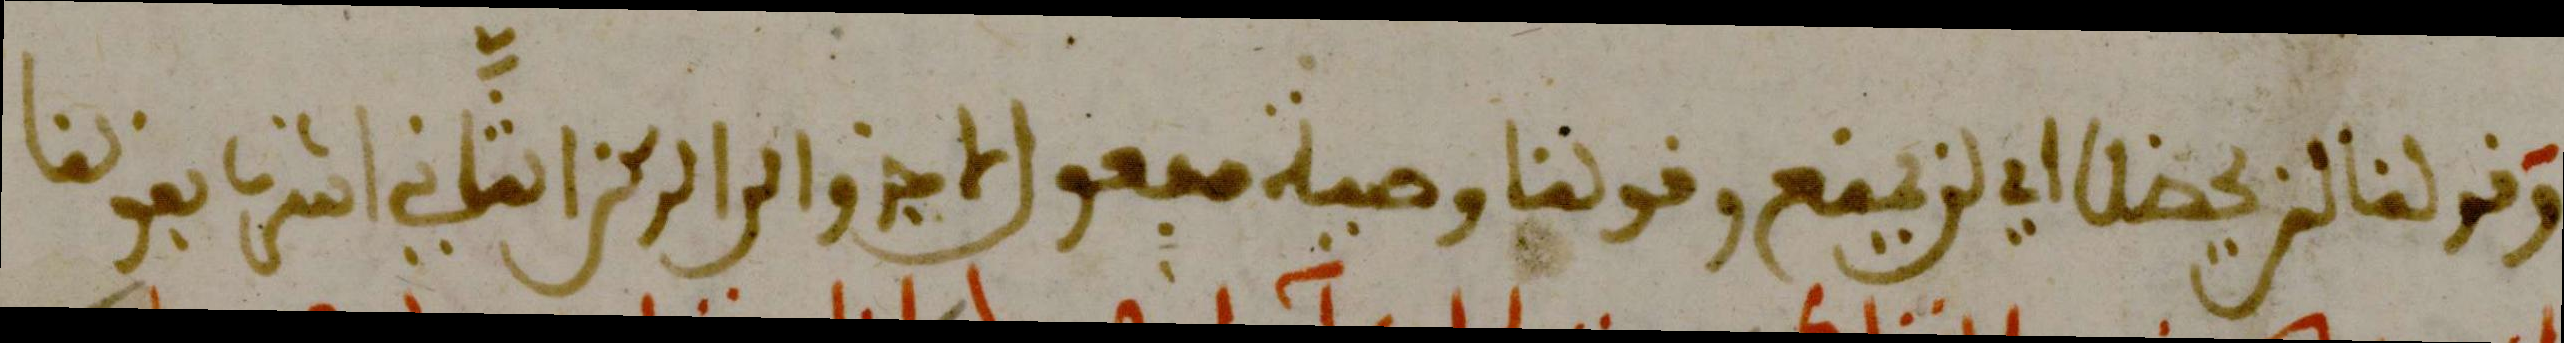وَقولنا لن يحضلا اي لن يمنع وقولنا وصية مفعول لاجز والى الركن الثّاني اشرن بقولنا
